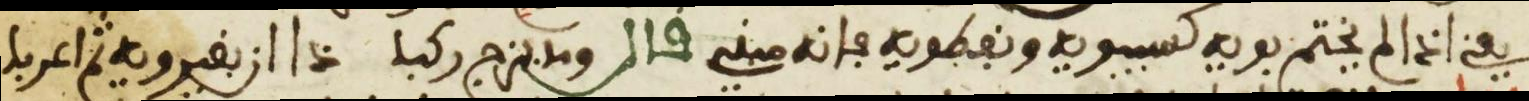يعني اذا لم يختم بويه كسبيويه و نفطويه فانه مبني قال و ما بمزج ركبا ذا ان بغيرويه ثم اعربا
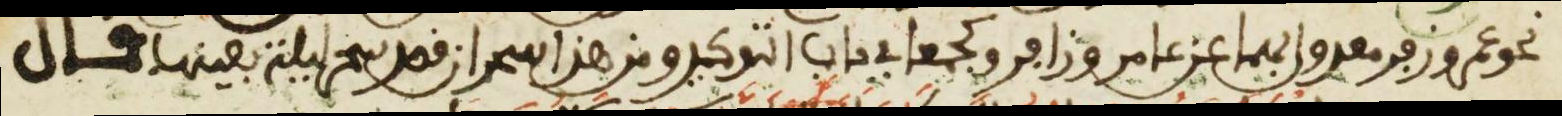نحو عمر و زفر معدول بهما عن عامر وزافر و كجمعا في باب التوكيد و من هذا سحران قصد سحرايلة بعينها قال
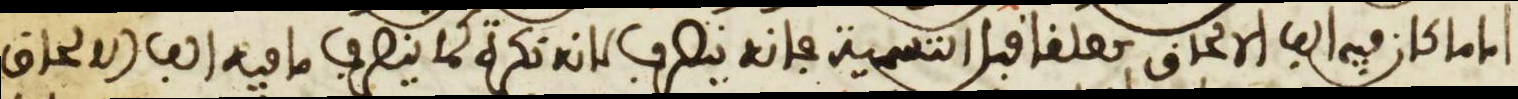اما ما كان فيه الف الالحاق كعلقا قبل التسمية فانه ينصرف لانه نكرة كما ينصرف ما فيه الف الالحاق
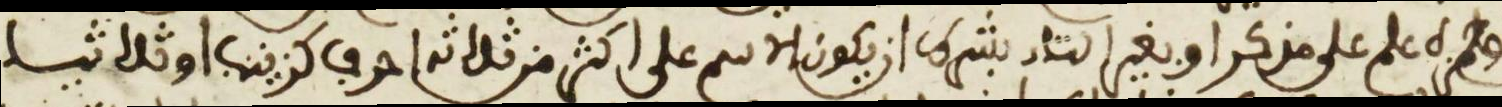و#زه علم على مذكراو بغير التاء بشرط ان يكون الاسم على اكثر من ثلاثة احرف كزينب او ثلاثيا
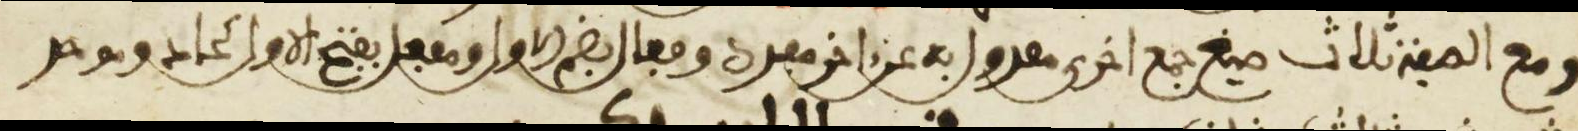ومع الصفة ثلاث صيغ جمع أخرى معدول به عن ءاخر مفرد و فعال بضم الأول و مفعل بفتح الأول كحاد و مو#د
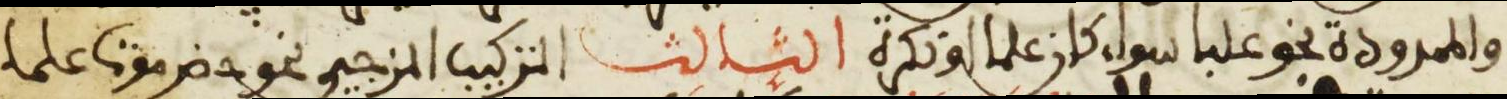والممدودة نحو علبا سواء كان علما او نكرة الثالث التركيب المزجي نحو حضر موت علما
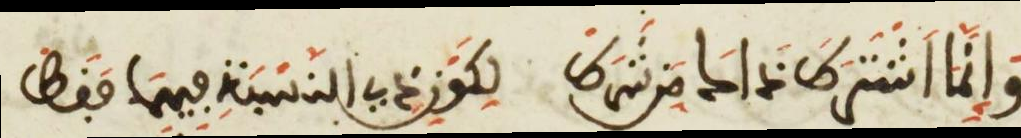وانما اشترط ذلك من شرط لكون ذي النسبة فيهما فقط
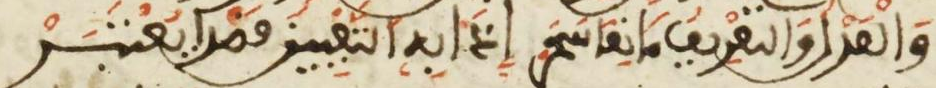و العدل والتعريب ما نعاسحر اذا به التعيين قصدا يعتبر
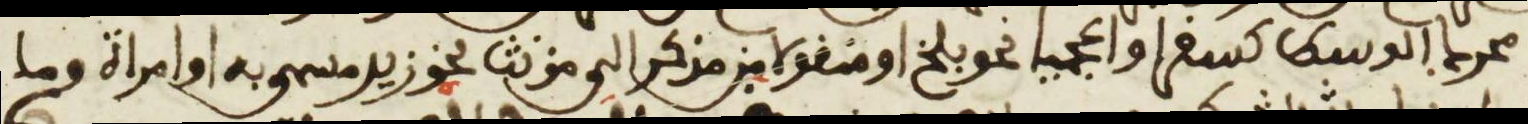محرك الوسط كسغراو اعجميا نحو بلخ او منقولا من مذكر الى مؤنث نحو زيد مسمى به او امراة و ما
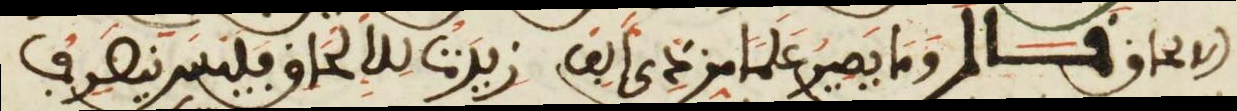الالحاق قال و ما يصير علما من ذى الف زيدت للالحاق فليس ينصرف
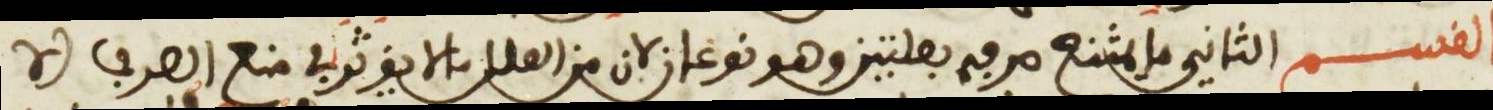القسم الثاني ما يمثنع صرفه بعلتين و هو نوعان لان من العلل ما لا يؤثر في منع الصرف الا
